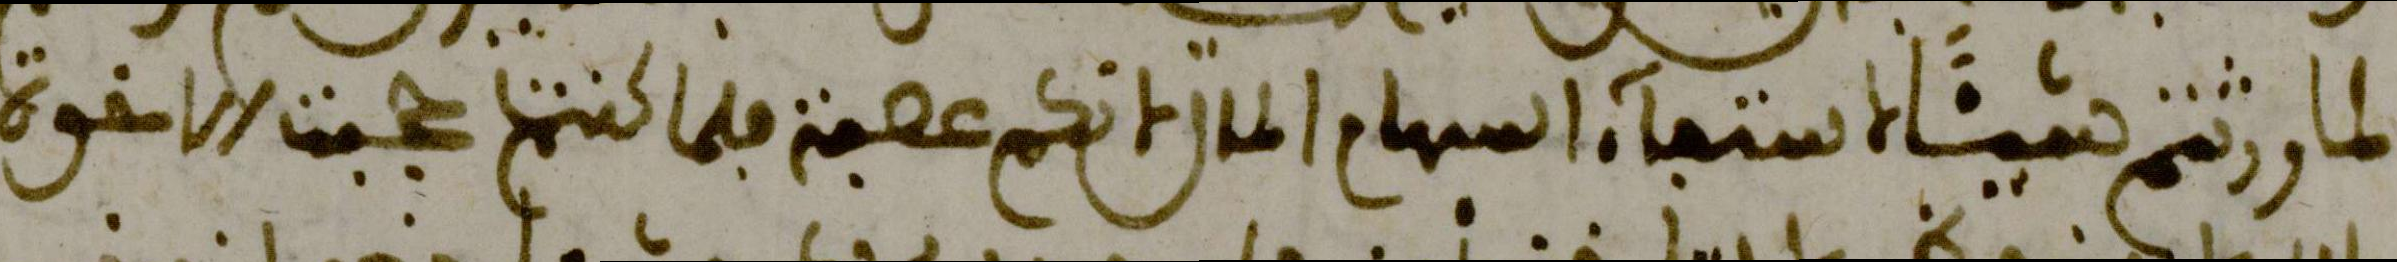لما ورثتهم شيئًا لا ستيفاء السهام المال لانكم عصبة فلما كنتم حجبت الاخوة
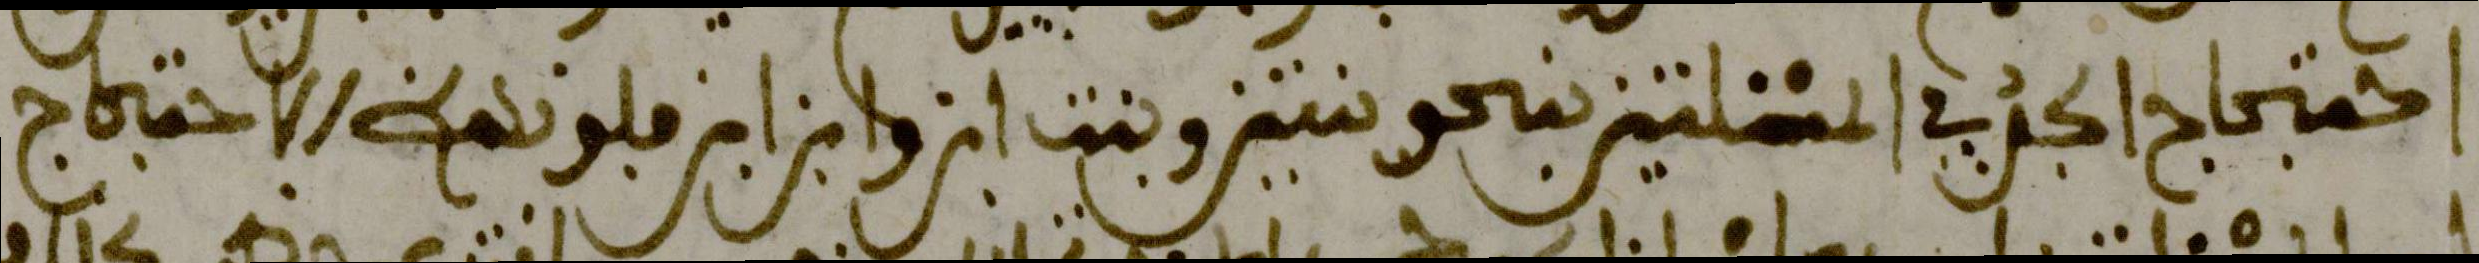احتجاج الجد في المسْئلتين بنحو بنتين وبنت ابن وابن ابن فلو نهض الاحتجاج
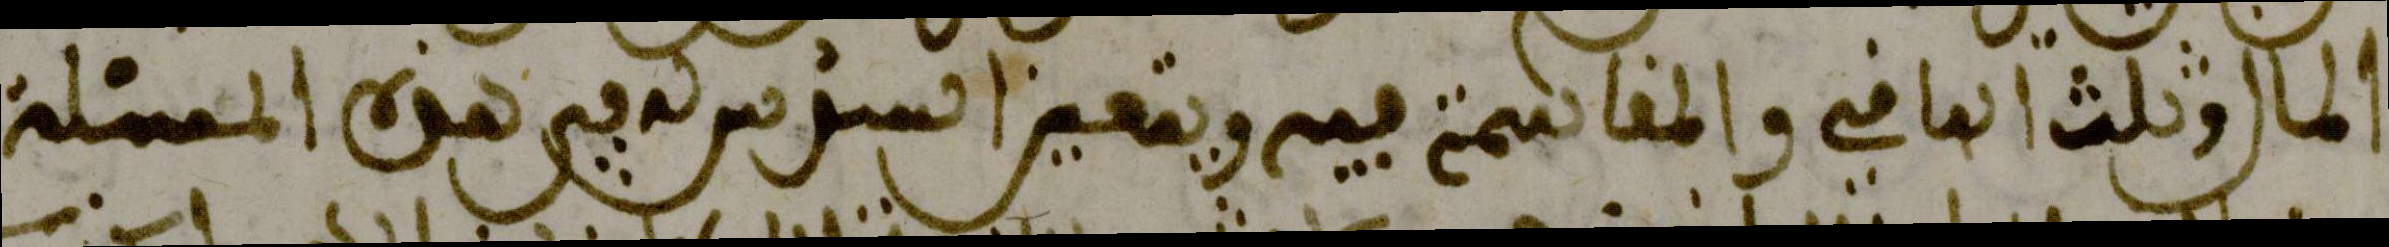المال وثلث الباقي والمقاسمة فيه ويتعين السدس له في هذه المسئلة
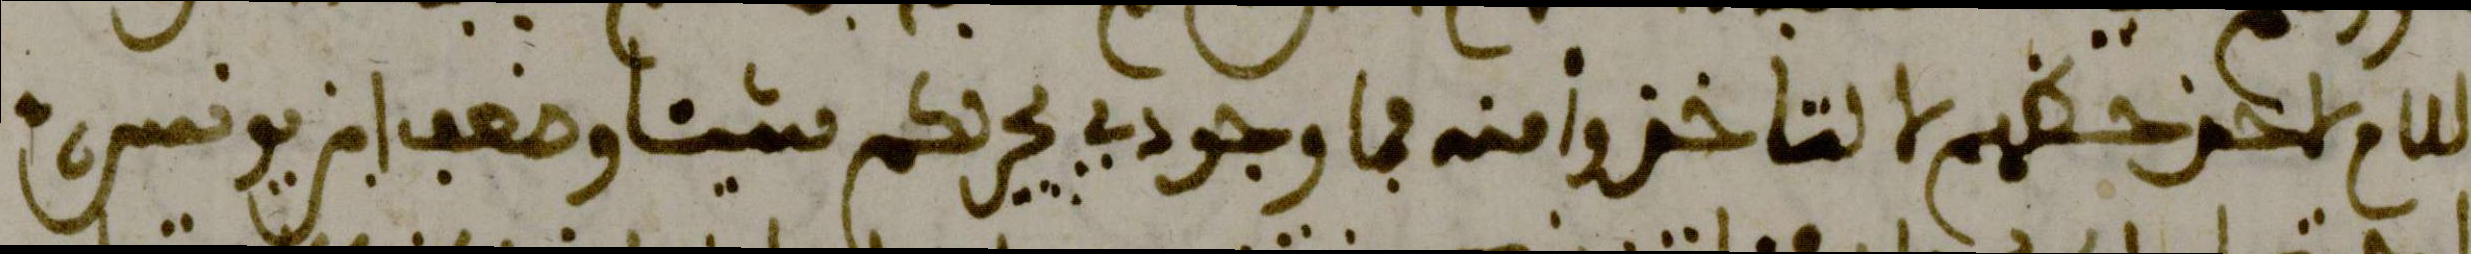للام لاحذ حظهم لا لتاخذوا منه فما وجودي يحد لكم شيئا وضعف ابن يونس
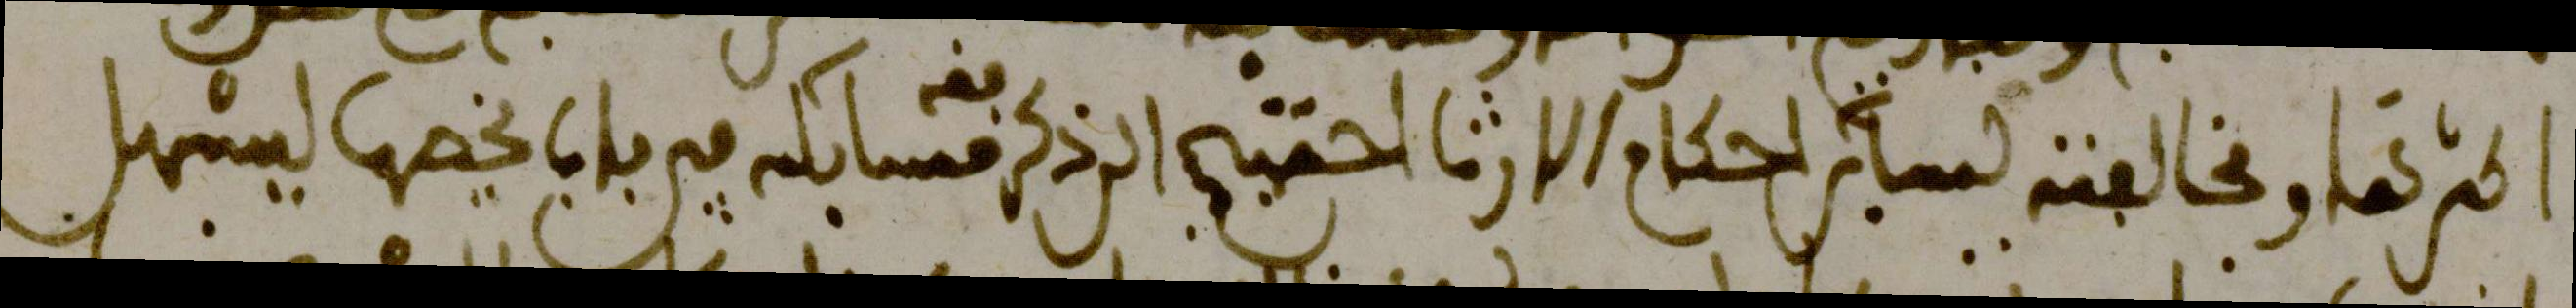اكثرها ومخالفته لسائر احكام الارث احتيج الى ذكر مسائله في باب بخصها ليسْهل
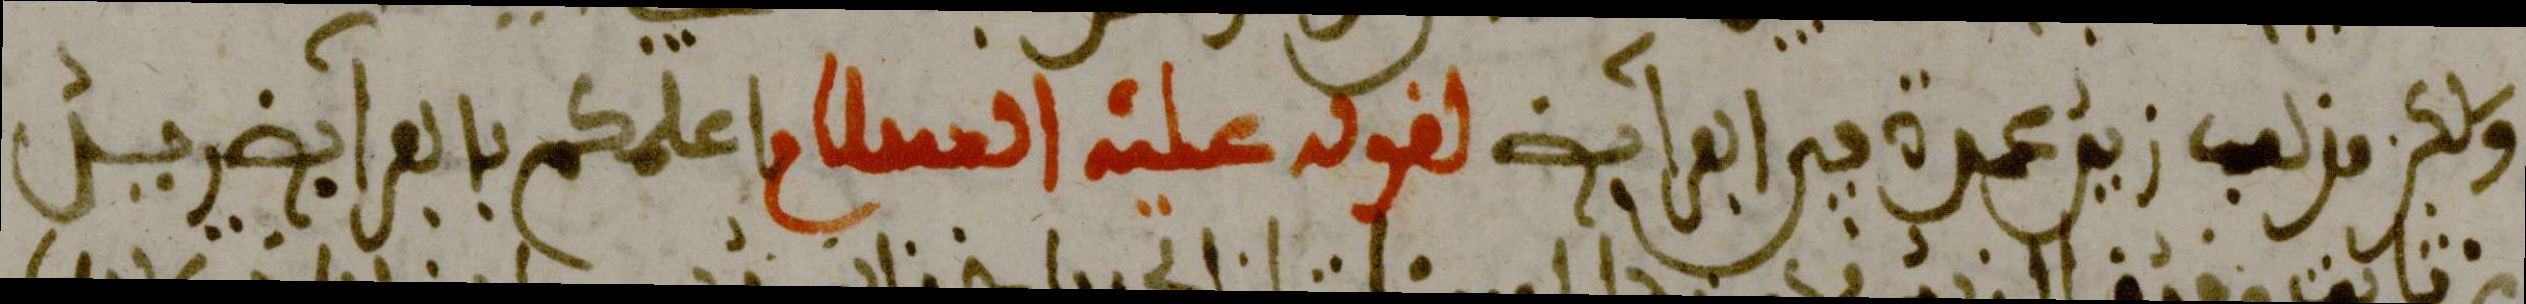ولاكن مذهب زيد عمدة في الفرائض لقوله عليْه السلام اعلمكم بالفرائض ريد
